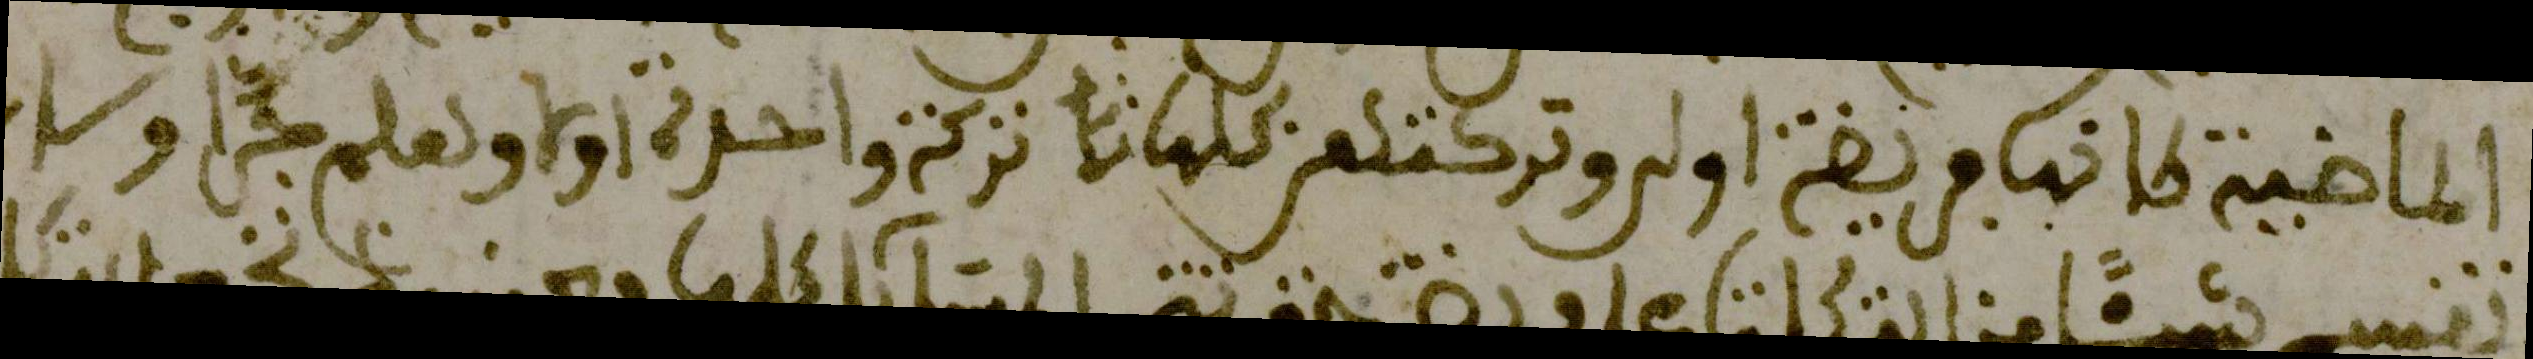الماضية كانها فريضة اولى وتركتهن كلها تركة واحدة اولا وهلم جرّ اولا
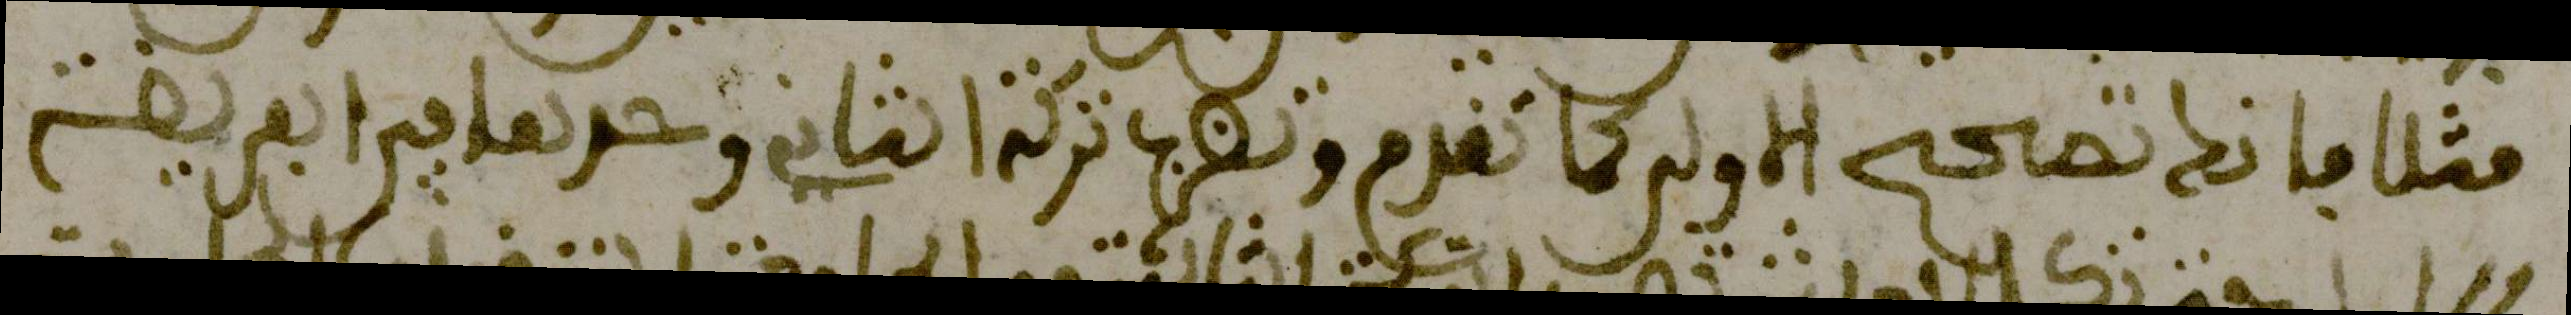مثلا فانك تصحح الاولى كما تقدم وتضرب تركة الثاني وحدها في الفريضة
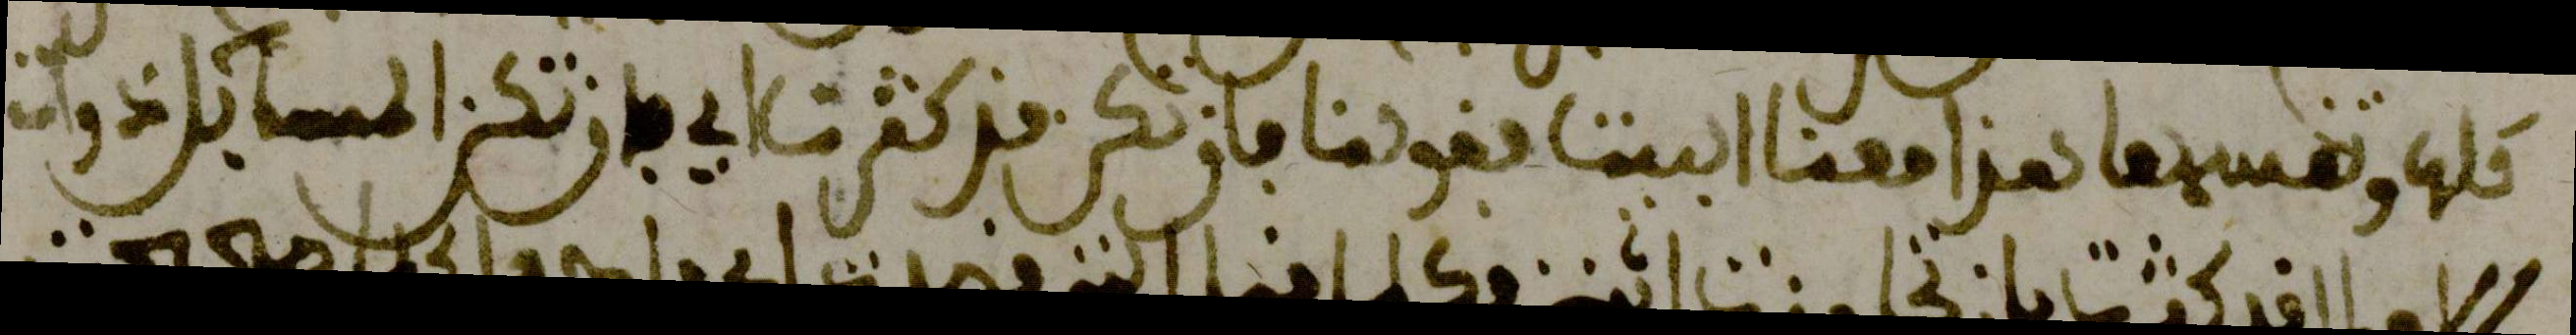كلها وتقسمهما هذا معنا البيت فقولنا فان تكن قد كثرت اي فان تكن المسائل ذوات
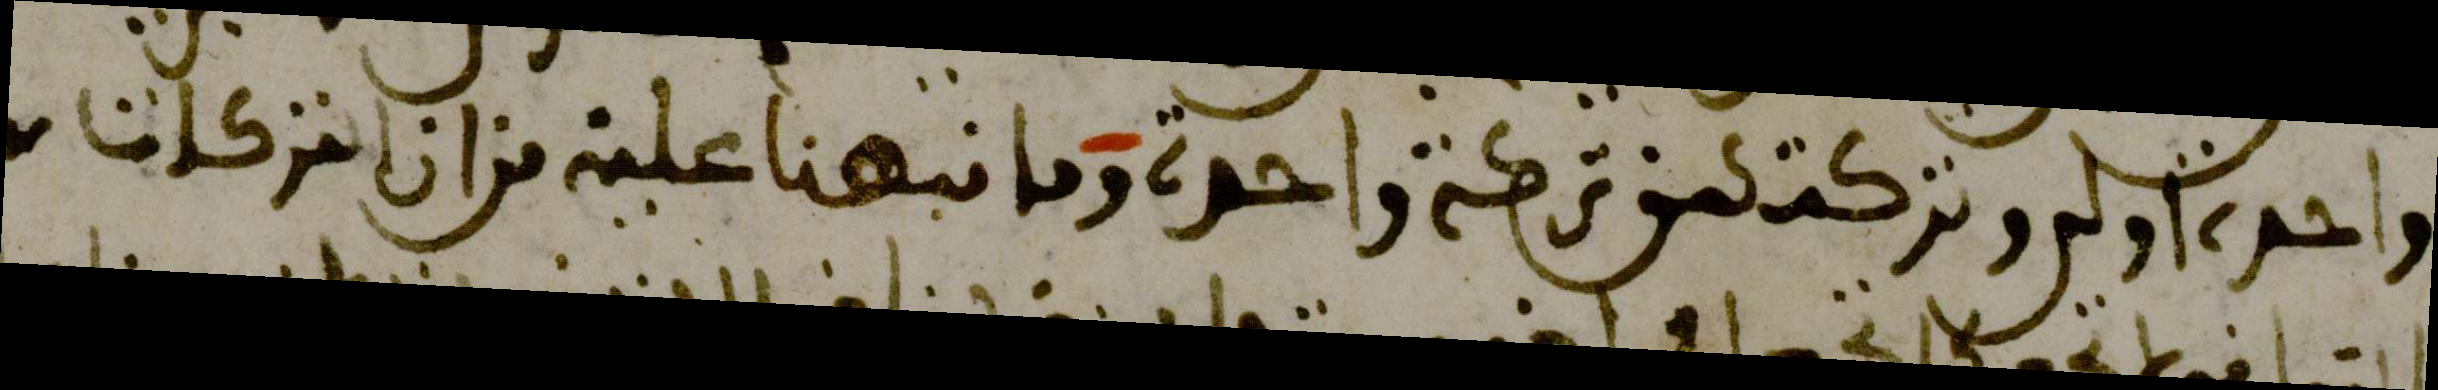واحدة اولى وتركتهن تركة واحدة وَما نبهنا عليْه من ان التركات
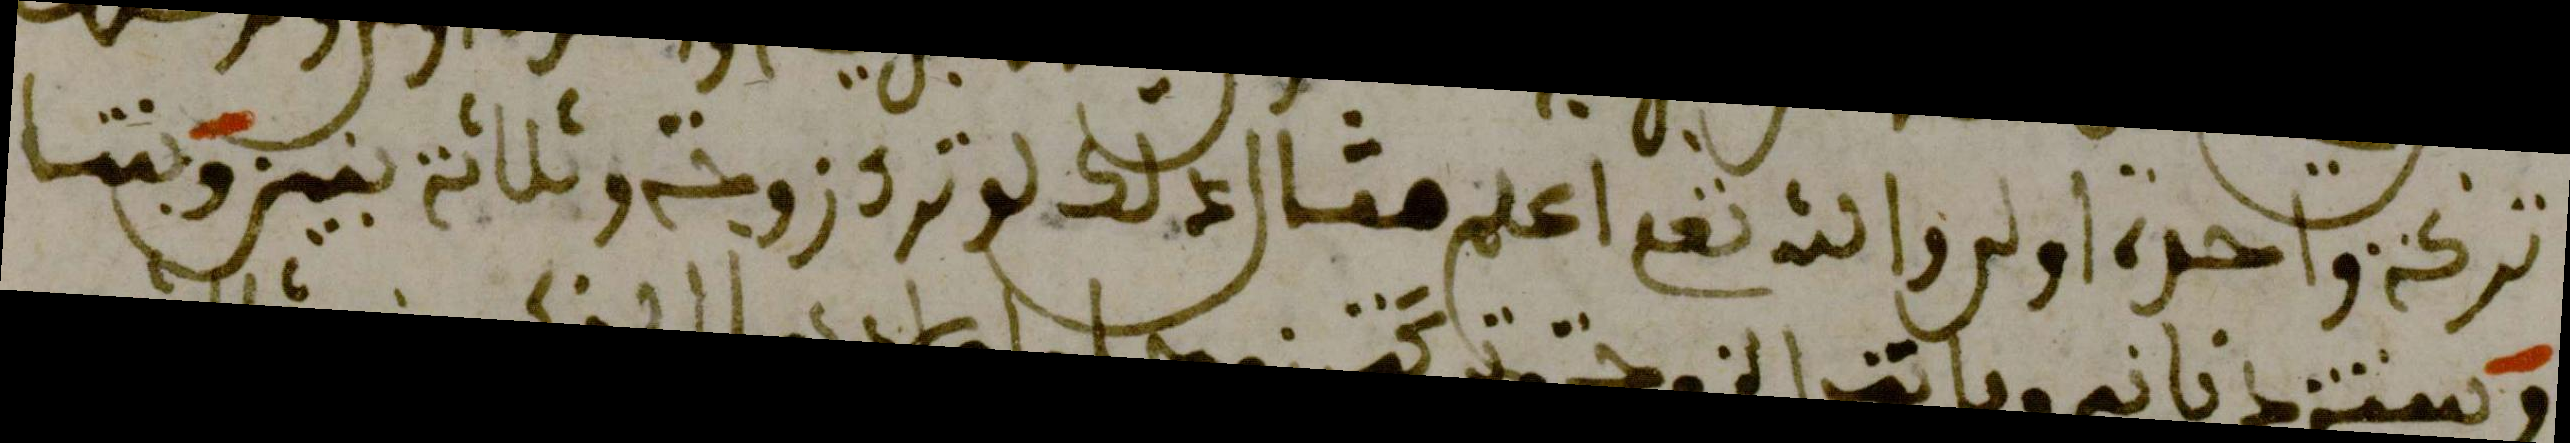تركة واحدة اولى الله تعلى اعلم مثال ذلك لو ترك زوجة وثلاثة بنين وَبنتا
